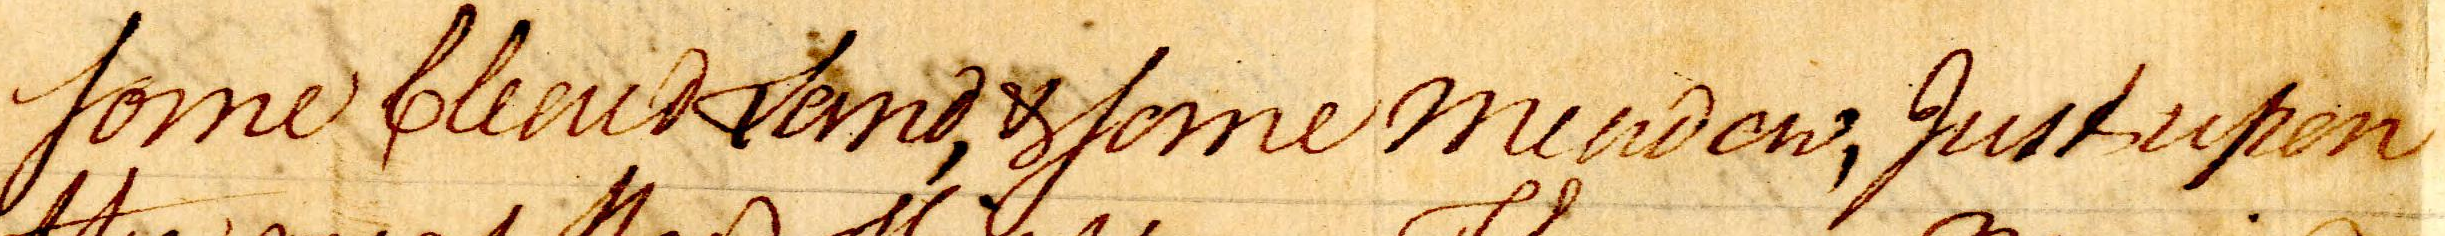fome Cleared Land, & some meadow, just upon
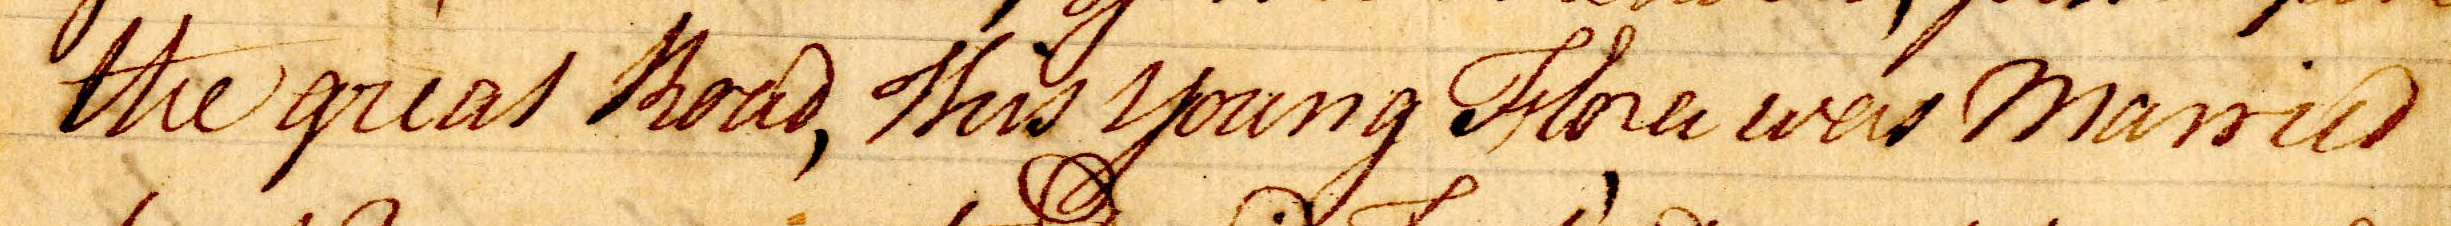the great Road, this young Flora was married
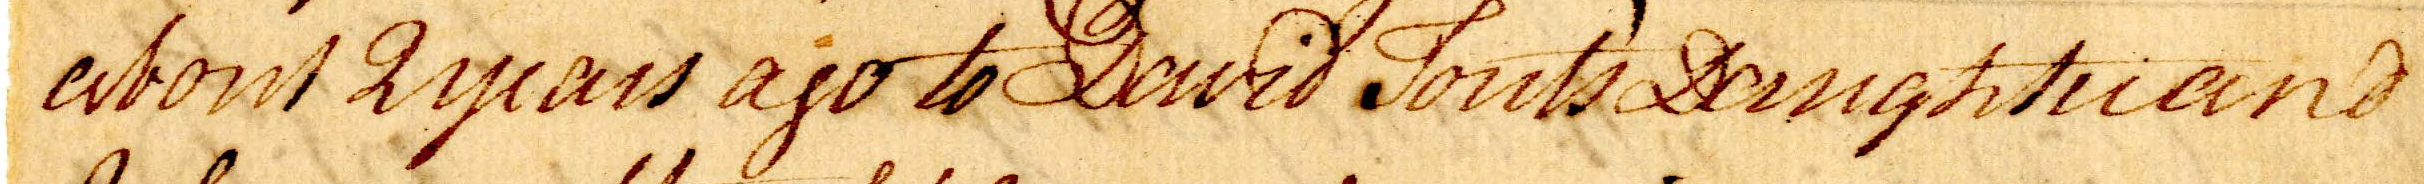about 2 years ago to David Tout's Daughter and
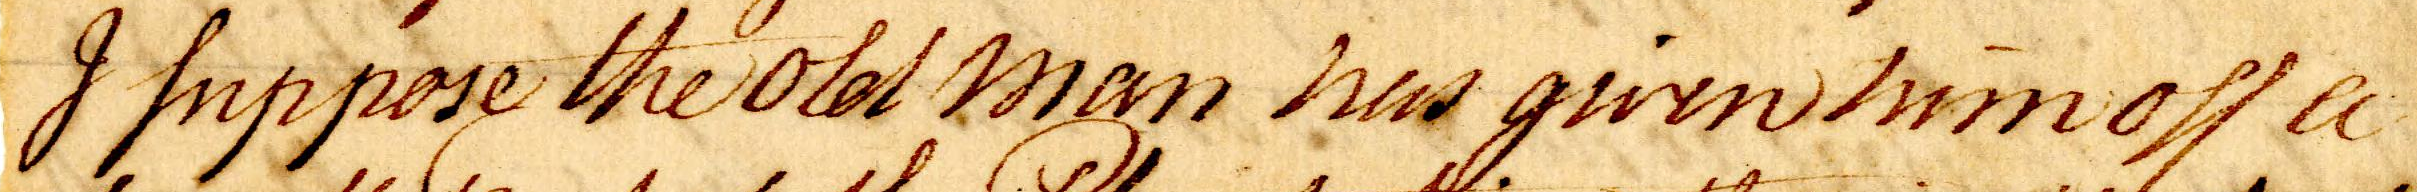I suppose the old man has given him off a
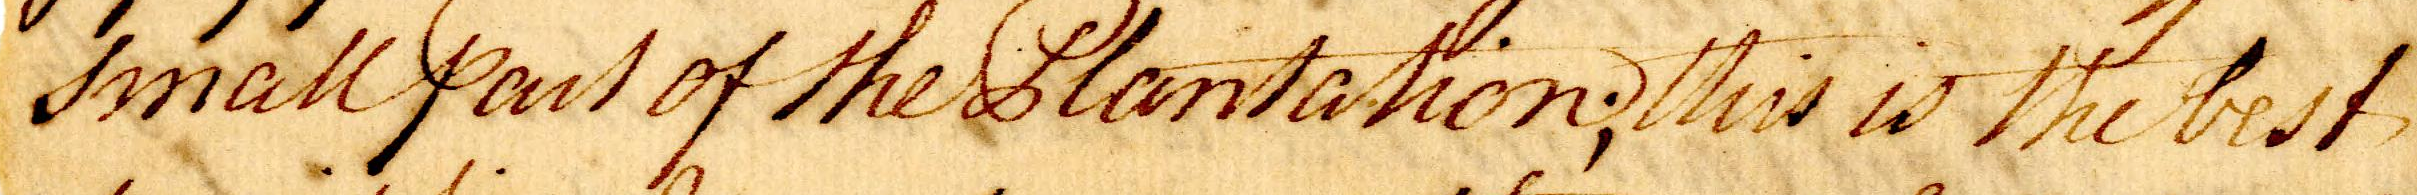small Part of the Plantation, this is the best
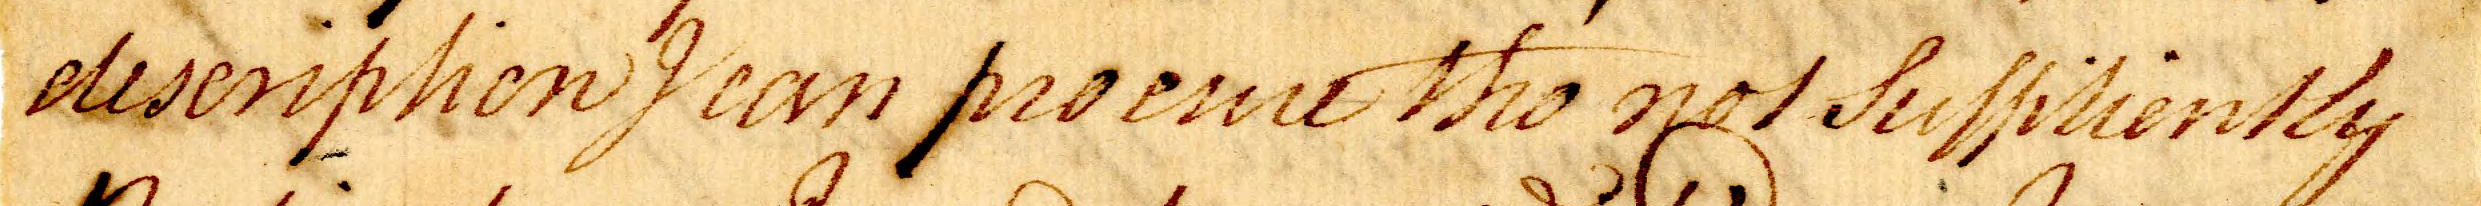description I can procure tho not Sufficiently
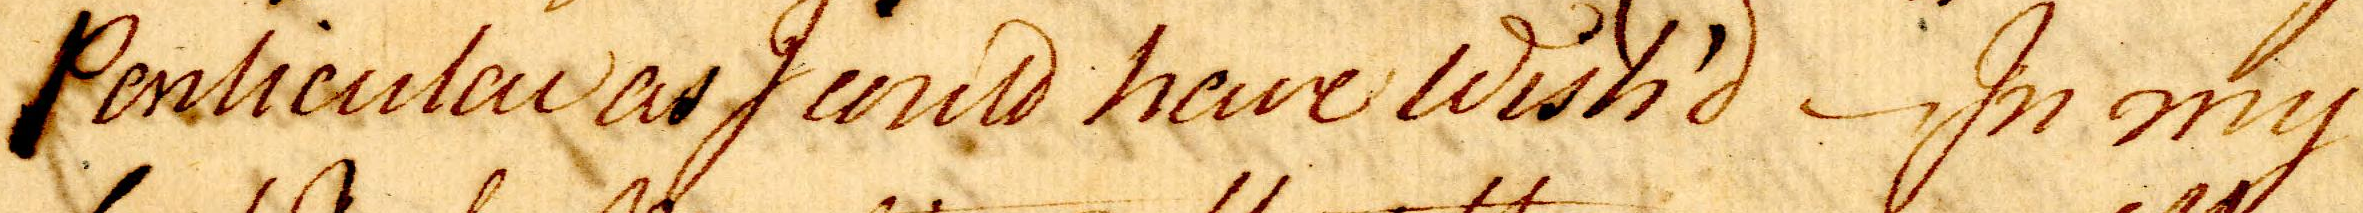Perticular as I could have wish'd- In my
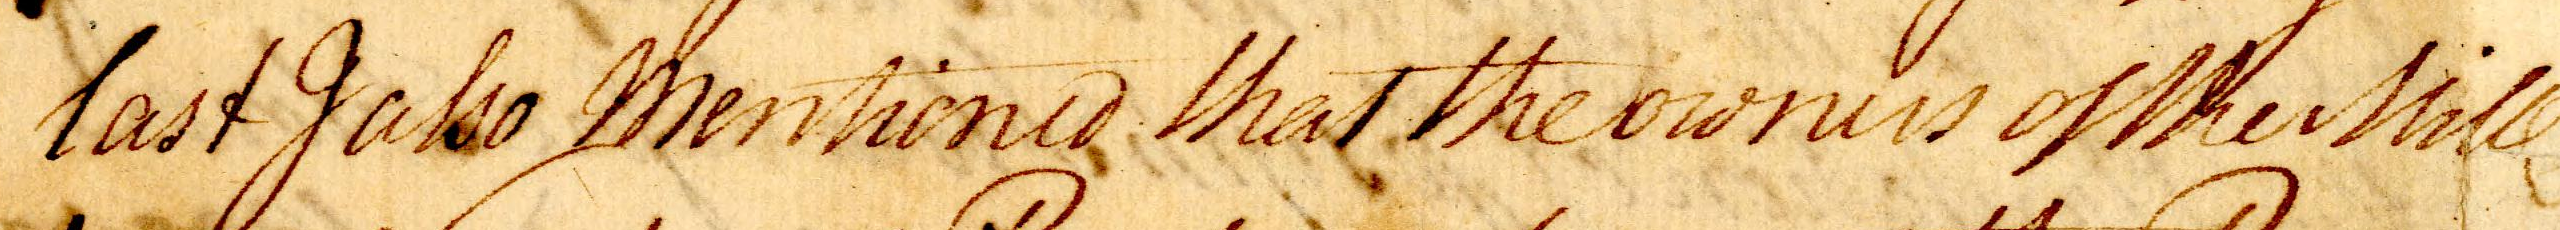last I also Mentioned that the owners of the Mill
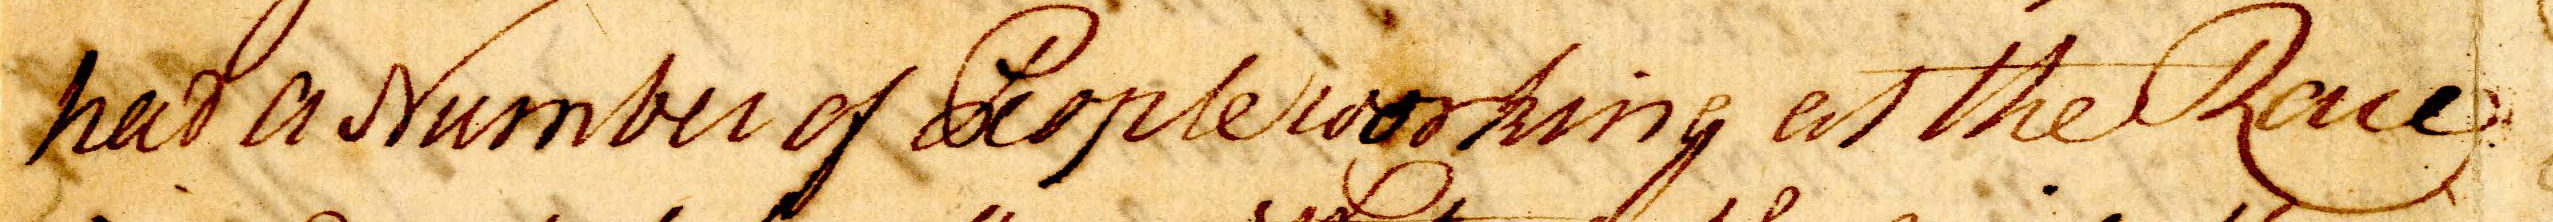had a Number of People working at the Race
